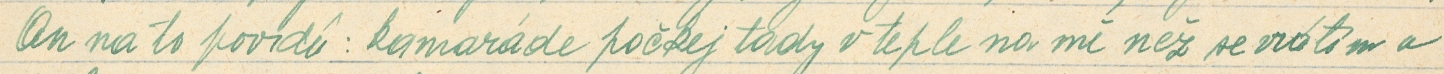On na to povídá: kamaráde počkej tady v teple na mě než se vrátím a
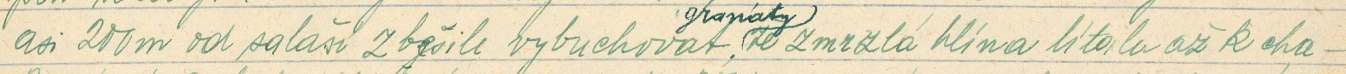asi 200 m od salaší zběsile vybuchovat granáty, ze zmrzlá hlína lítala až k cha-
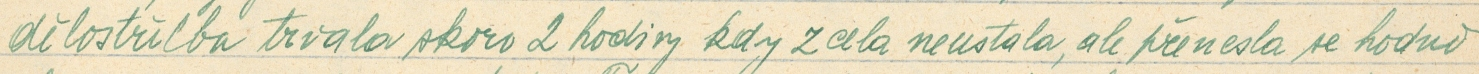dělostřelba trvala skoro 2 hodiny kdy zcela neustala, ale přenesla se hodně
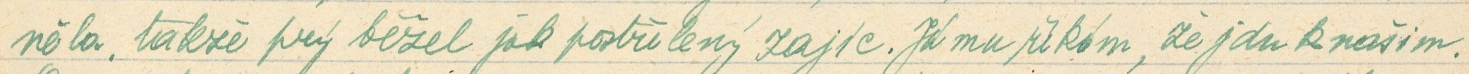něla, takže prý běžel jak postřelený zajíc. Já mu říkám, že jdu k našim.
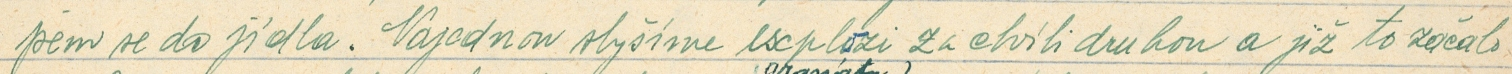jsem se do jídla. Najednou slyšíme explozi za chvíli druhou a již to začalo
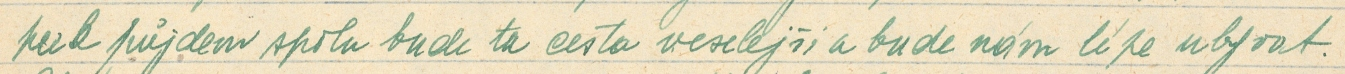pak půjdem spolu bude ta cesta veselejší a bude nám lépe ubývat.
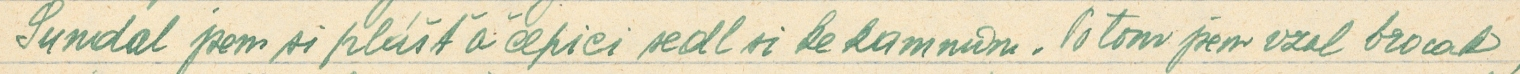Sundal jsem si plášť a čepici sedl si ke kamnům. Potom jsem vzal brocak
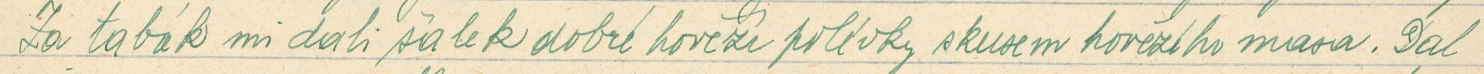Za tabák mi dali šálek dobré hovězí polévky s kusem hovězího masa. Dal
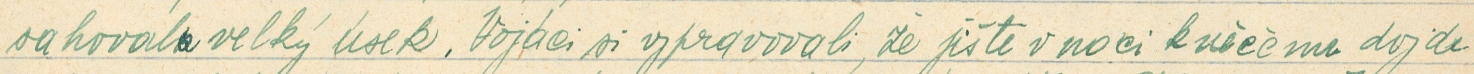sahovala velký úsek. Vojáci si vypravovali, že ještě v noci k něčemu dojde
